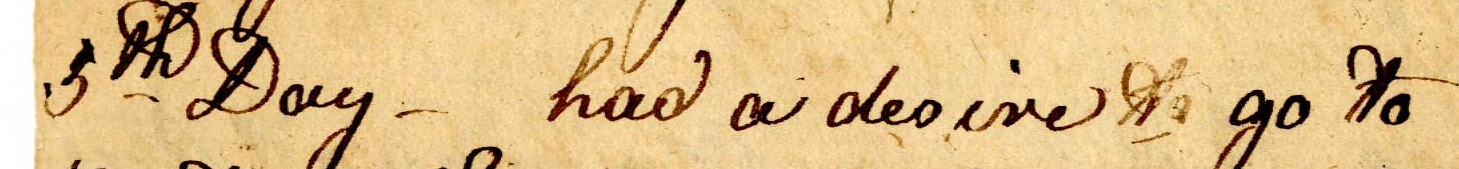5^th Day- had a desire to go to
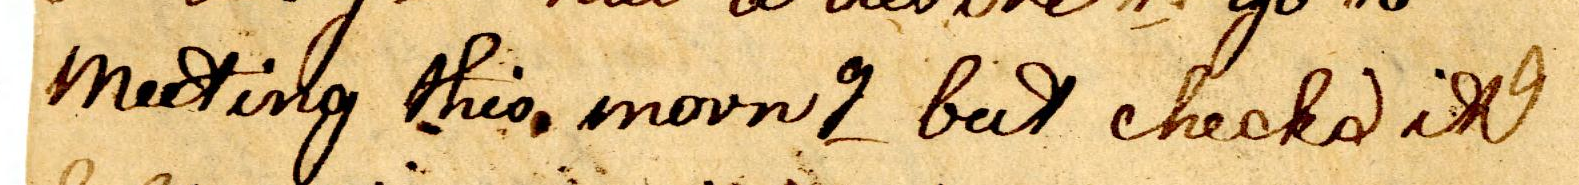Meeting this morn^g but checkd it
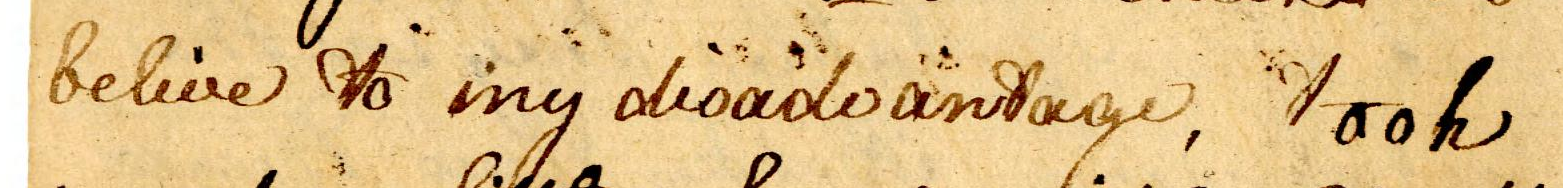belive to my disadvantage, took
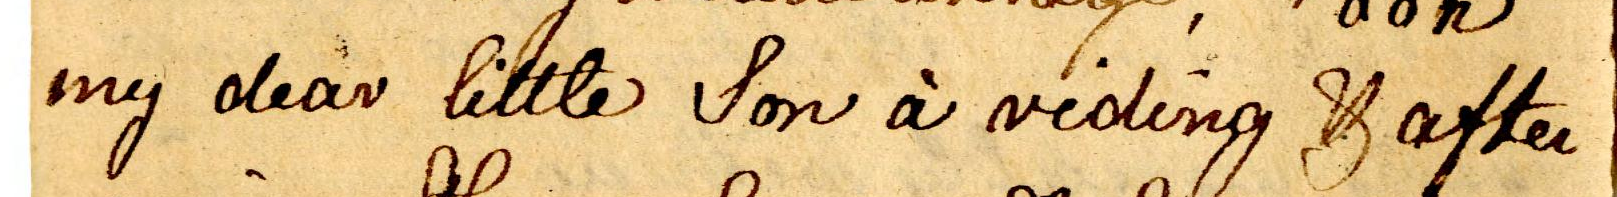my dear little Son a riding & after
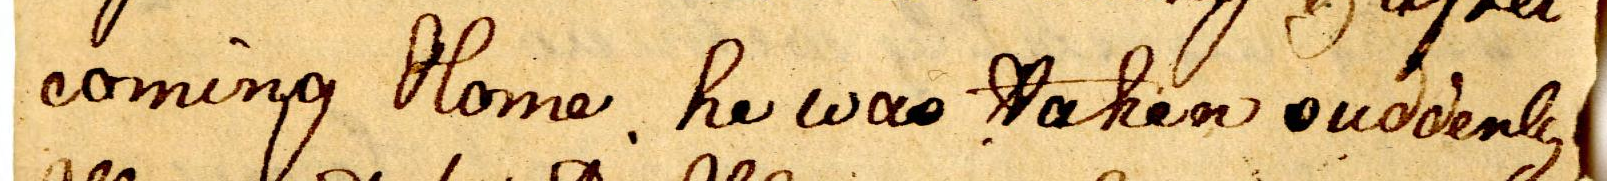coming Home he was taken suddenly
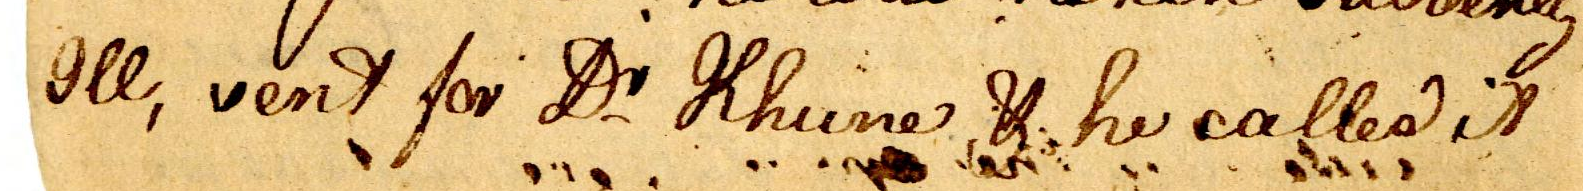Ill, sent for D^r Khune & he called it
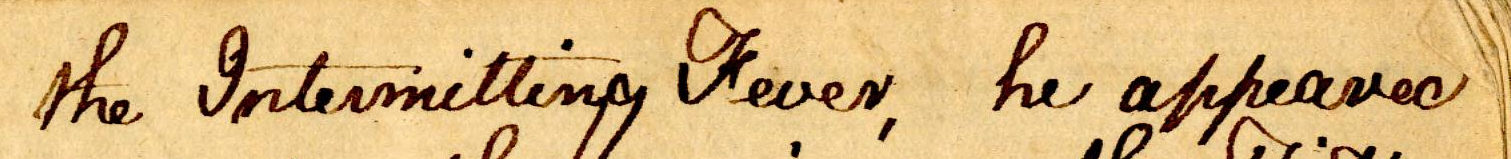the Intermitting Fever, he appeared
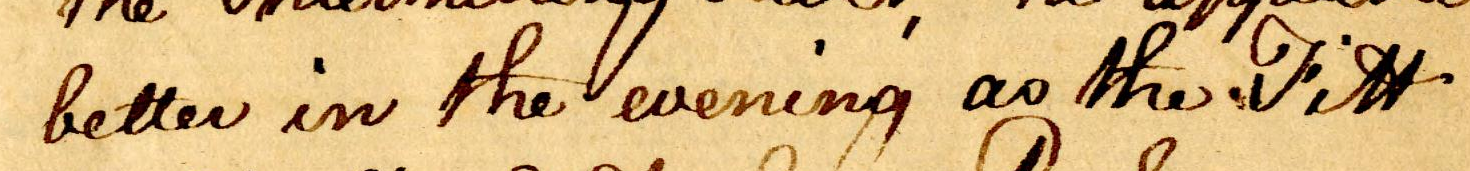better in the evening as the Fitt
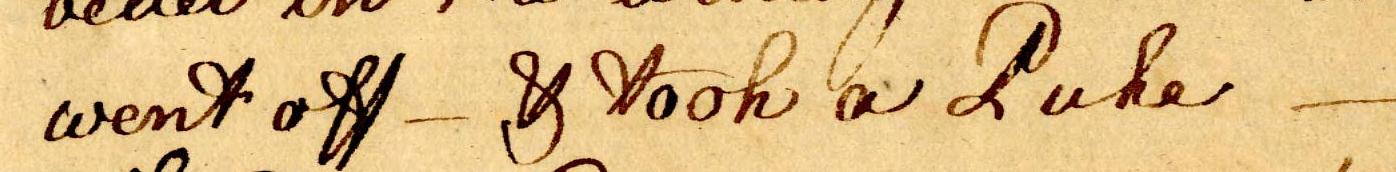went off- & took a Puke-
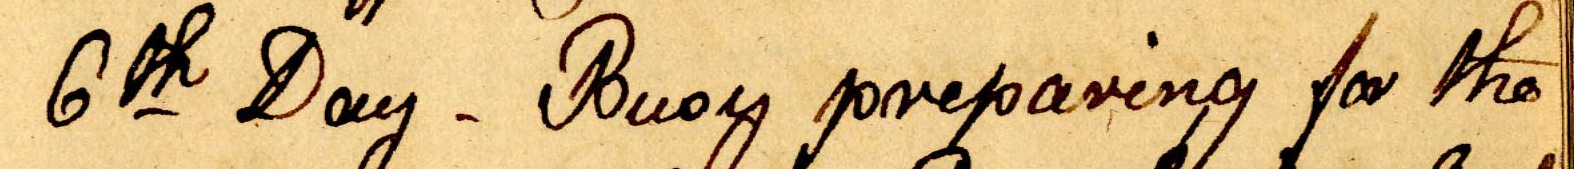6^th Day- Busy preparing for the
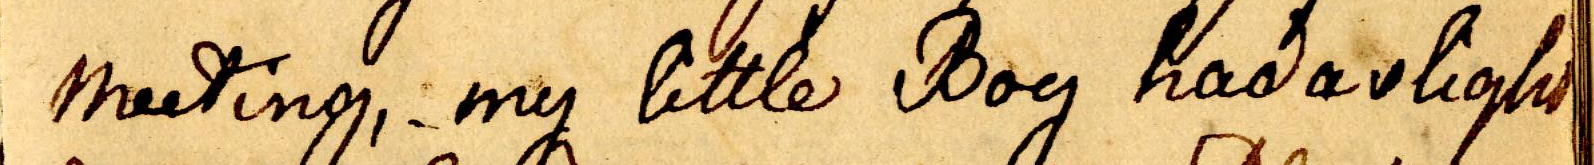Meeting, my little Boy had a slight
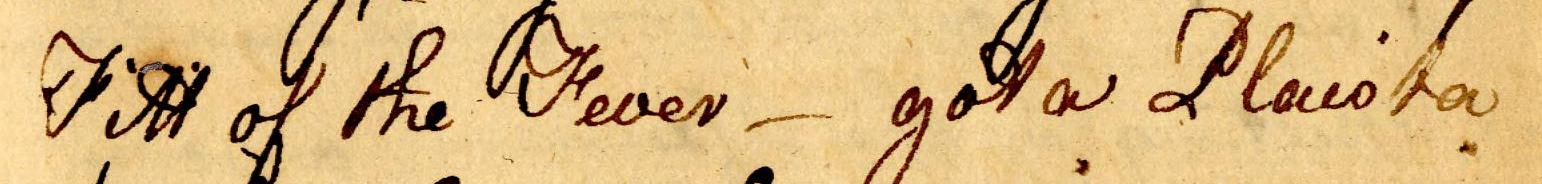Fitt of the Fever- got a Plaistor
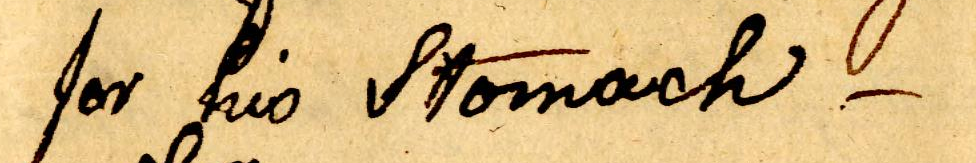for his Stomach -
